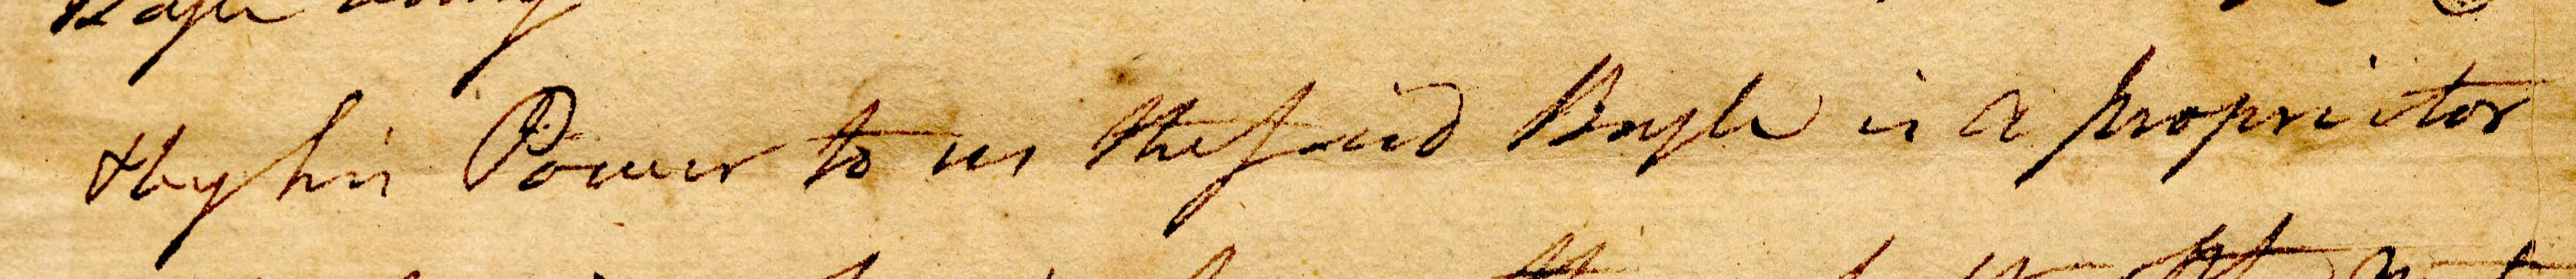& by his Power to us the said Boyle is a proprietor
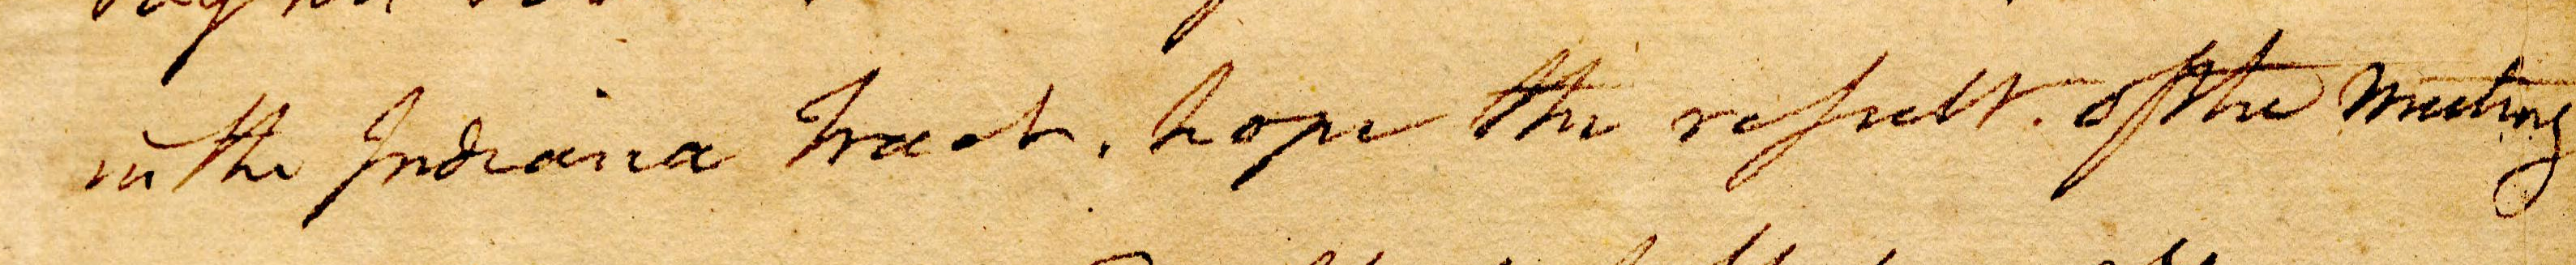in the Indiana Tract, hope the rest of the meeting
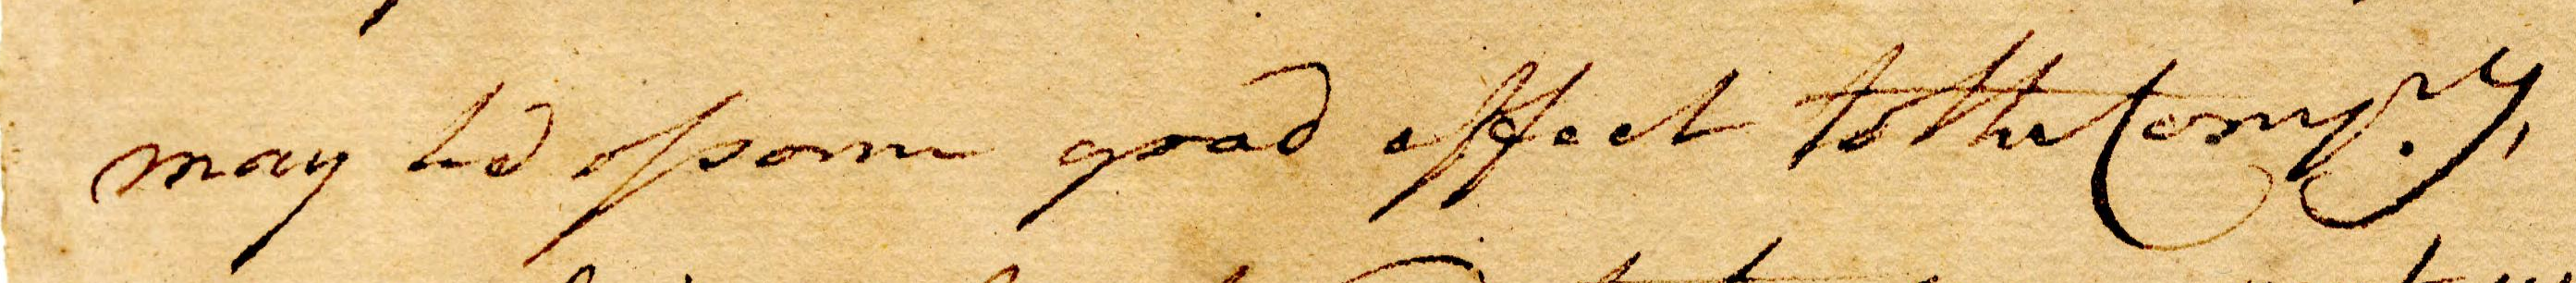may be of some good effect to the Comp^y.
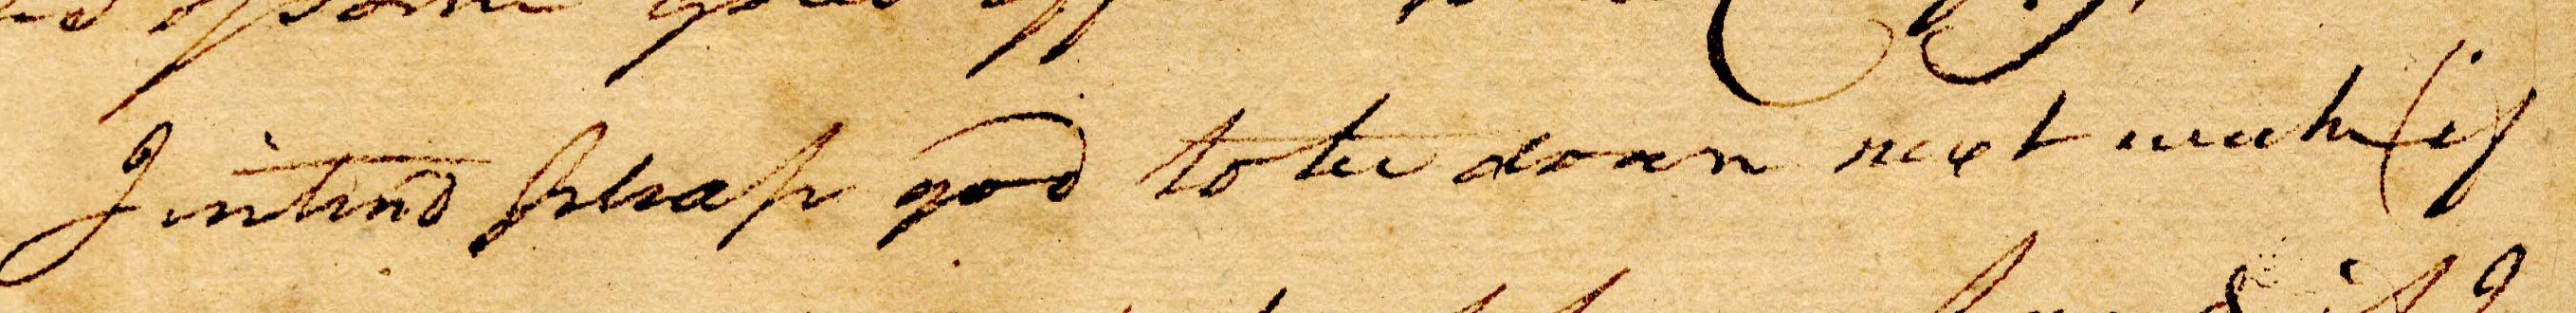I intend please God to be down next week (if
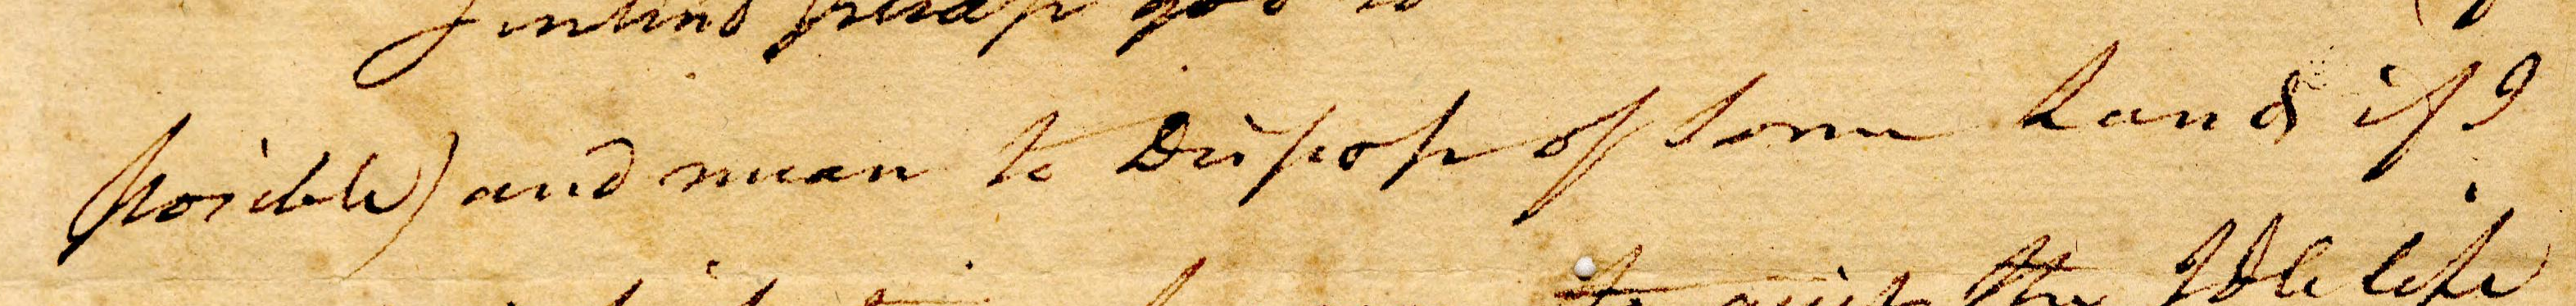posible) and mean to Dispose of some Land if I
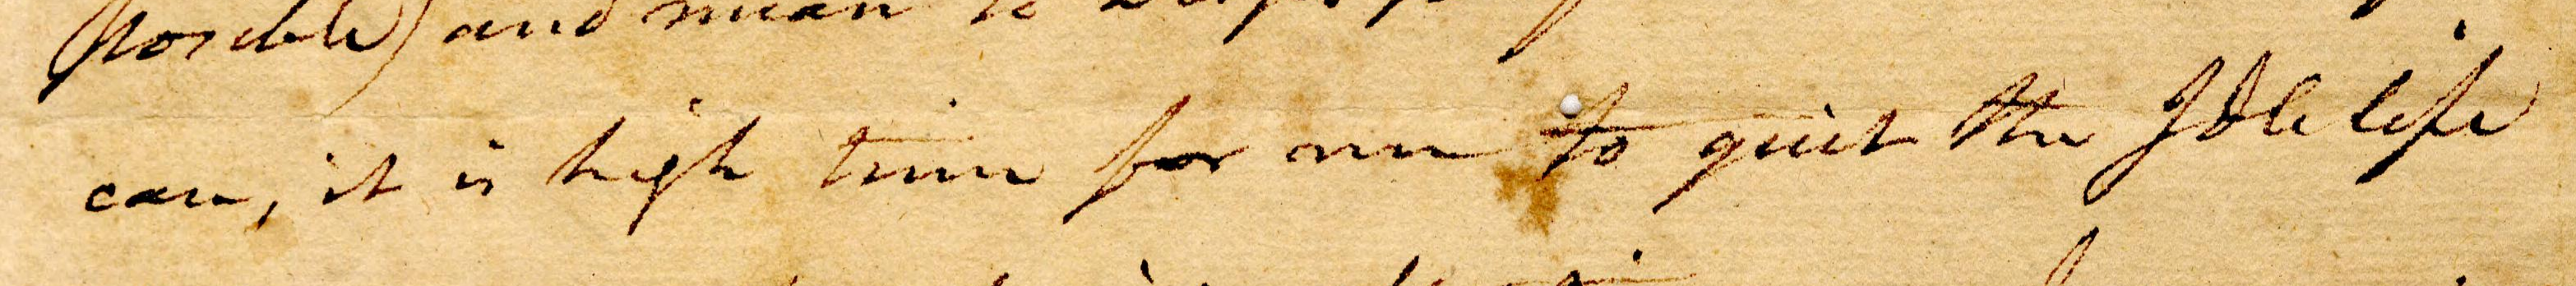can, it is high time for me to quit the Idle life
